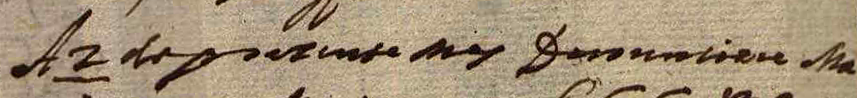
A 2 do prezente mes Denunciou Ma
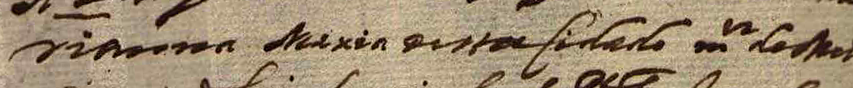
rianna Mexia desta Cidade mer de Mel
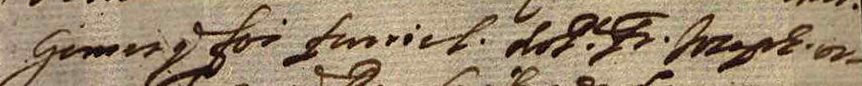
Gomes q̄ foi furriel. do P.e Fr. Iozeph. or
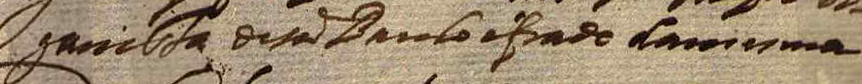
ganista de saõ Paulo e frade da mesma
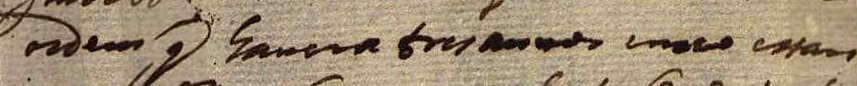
ordem q̄ hauera tres anos e meo estan
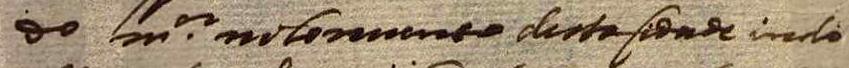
do m.or no Conuento desta Cidade indo
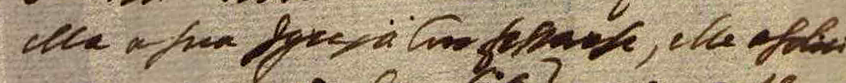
ella a sua Jgreja confessarse, elle a solici
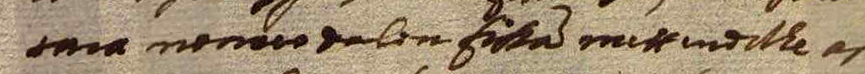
tara no meo da confissaõ mettendelhe as
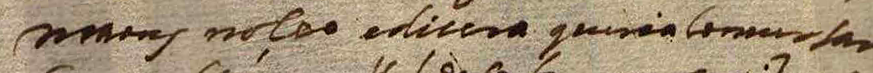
maons no ceo e dicera queria conuersar
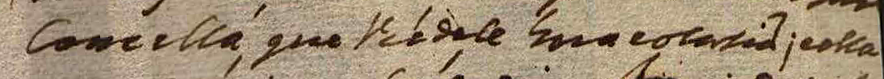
Com ella, que lhe dece hora e ocaziā; e ella
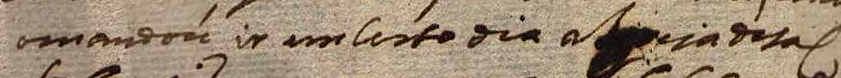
o mandou ir em certo dia a Igreia de saꝭ
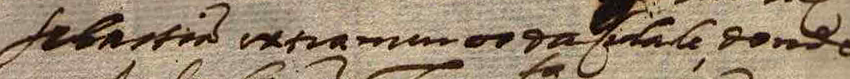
sebastiā extra muros da Cidade, donde
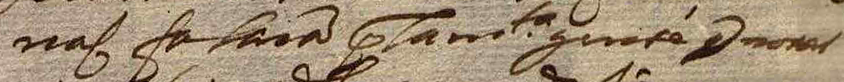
naꝭ falarā p̄la m.ta gente q̄ no tal
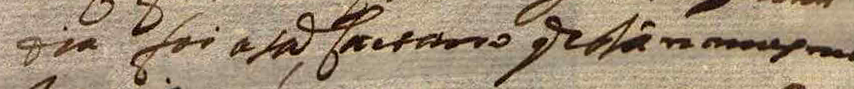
dia foi a sā Caetano q̄ está na mesma
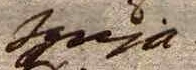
Igreja.
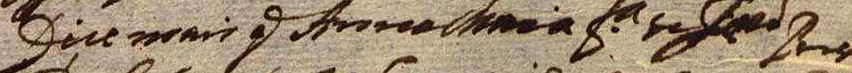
Dice mais q̄ Anna Maria f.a de Joaõ Peres
